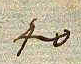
40
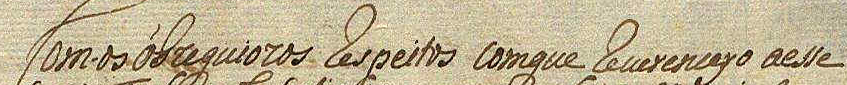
Com-os obzequiozos Respeitos com que Reuerenceyo a esse
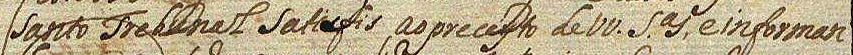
santo Trebunal satisfis ao precepto de vv. S.as. e informan
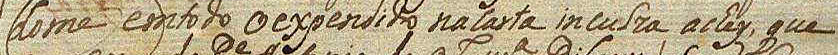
dome em todo o expendido na carta inculza achey, que
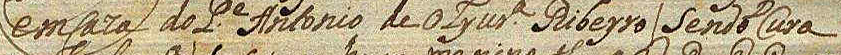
em Caza do P.e Antonio de Olyur.a Ribeyro / sendo Cura
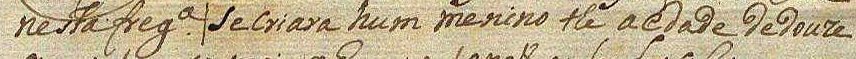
nesta freg.a / se criara hum menino the a edade de douze
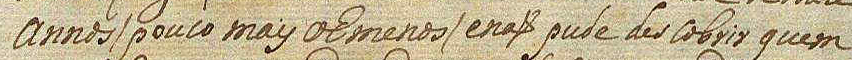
annos / pouco mais oh menos / e naõ pude descobrir quem
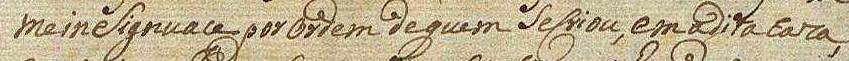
me insignuace por ordem de quem se Criou, em a dita caza,
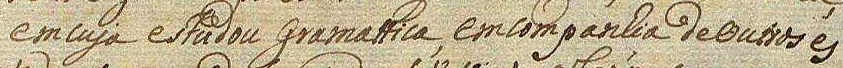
em cuja estudou Gramattica, em companhia de outros es
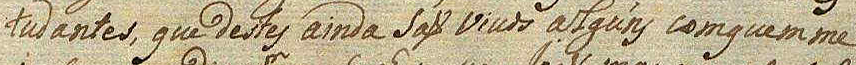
tudantes, que destes ainda saõ viuos algūns com quem me
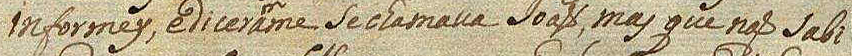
informey, e diceramme se chamaua Ioaõ, mas que naõ sabi
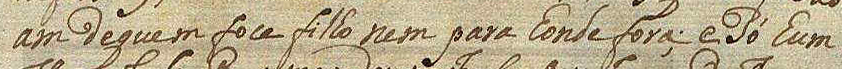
am de quem foce filho nem para honde fora; e só hum
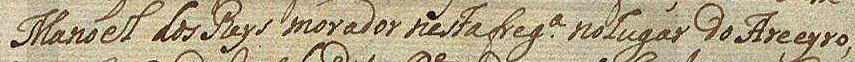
Manoel dos Reys morador nesta freg.a no Lugar do Areeyro,
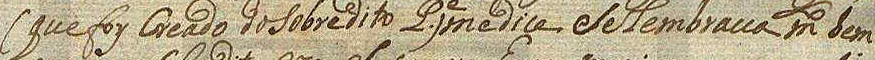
(que foy Creado do sobredito P.)e me dice Se lembraua mto bem
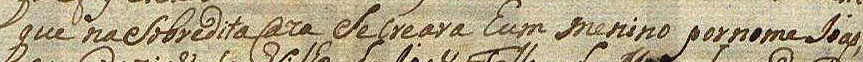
que na Sobredita Caza Se creara hum menino por nome Ioaõ,
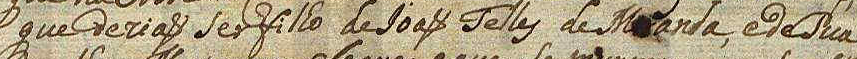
que deziaõ ser filho de Ioaõ Telles de M_randa, e de sua
